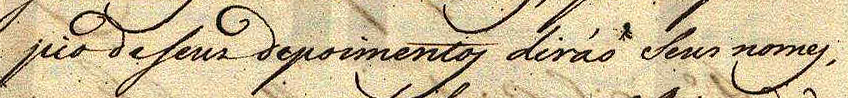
pio de seus depoimentos dirão seus nomes,
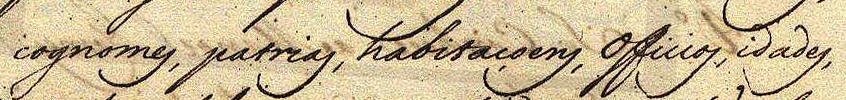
cognomes, patrias, habitaçoens, Officios, idades,
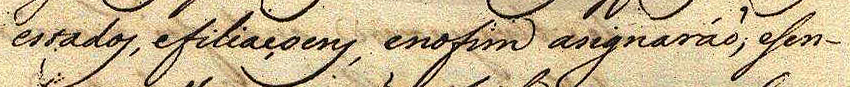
estados, e filiaçoens, e no fim asignaraõ, e sen
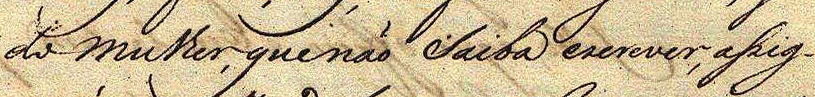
do mulher, que não saiba escrever, assig
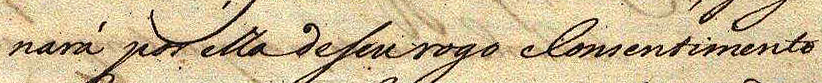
nará por ella de seu rogo e Consentimento
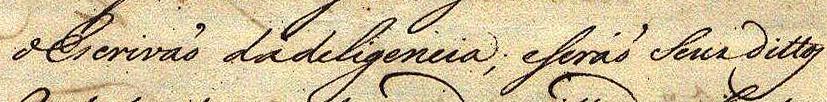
o Escrivaõ da deligencia; e seraõ seus dittos
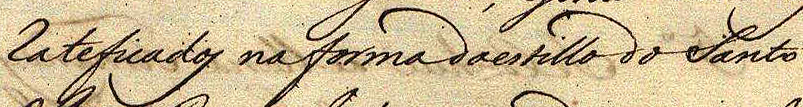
Rateficados na forma da estillo do Santo
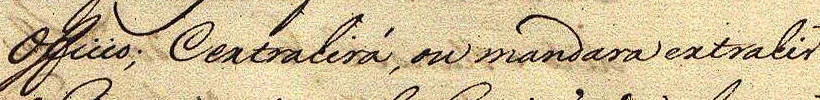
Officio; E extrahirá, ou mandara extrahir
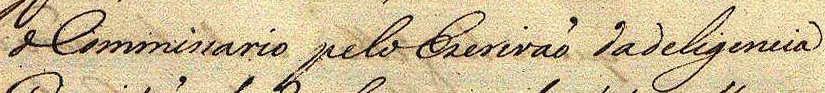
o Commissario pelo Escrivaõ da deligencia
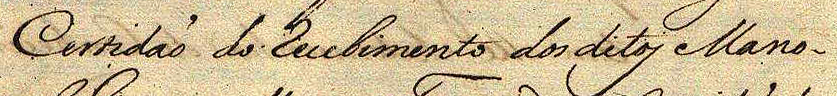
Certidaõ do Recebimento dos ditos Mano
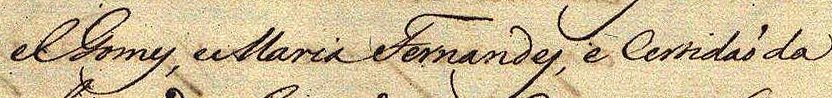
el Gomes e Maria Fernandes, e Certidaõ da
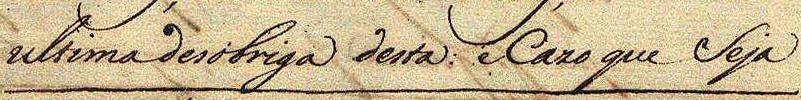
ultima desobriga desta: e Cazo que Seja
